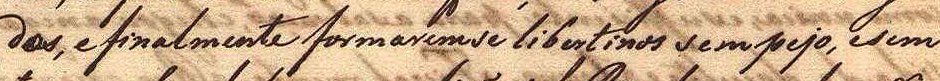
dos, e finalmente formaremse libertinos sem pejo, e sem
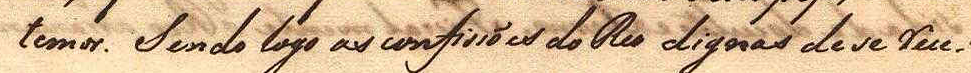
temor. Sendo logo as confissões do Reo dignas de se rece
